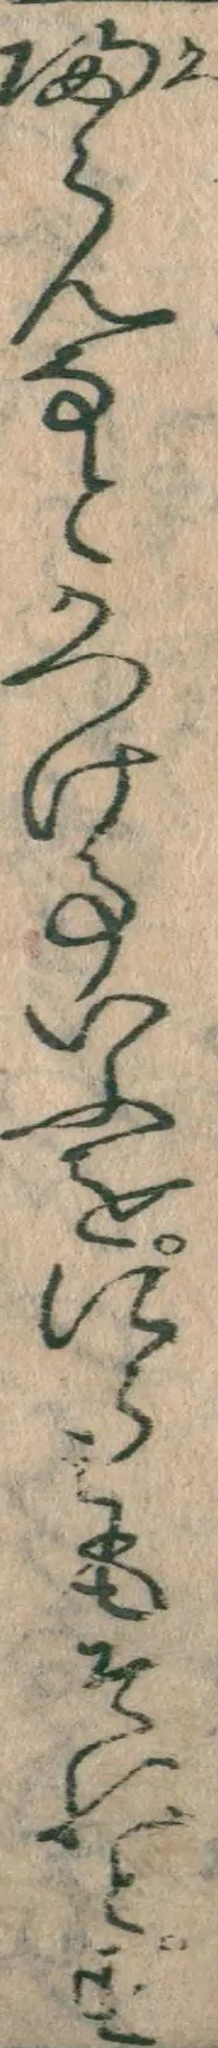帰らんなとかつけ事いふを。にらみもそれと。す
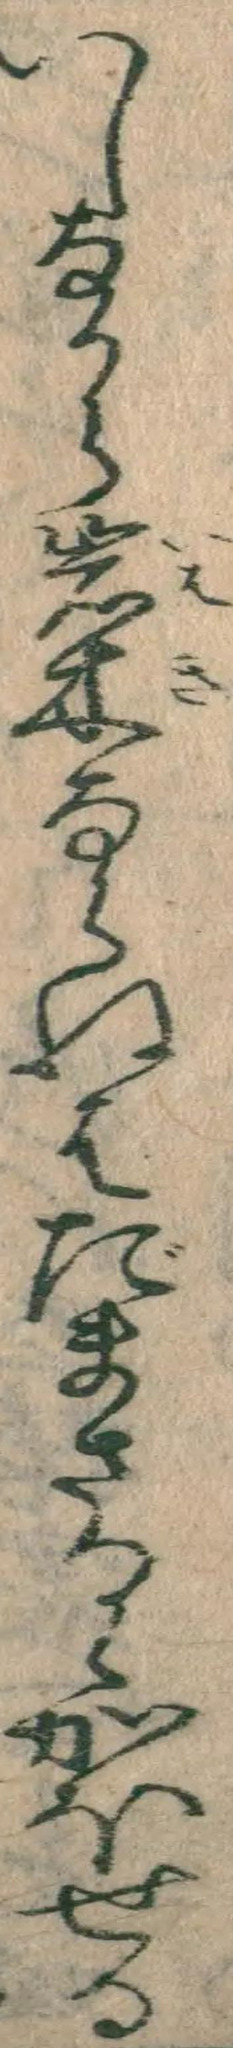いしなから岩木ならねはだまさるゝかほせる
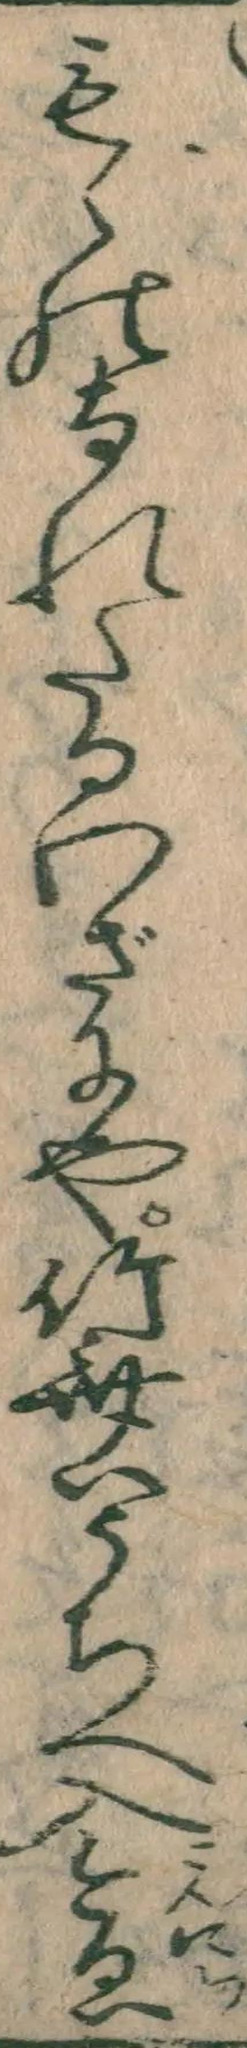もゝのなれたるわざにや。竹斎はうちへ入今日は

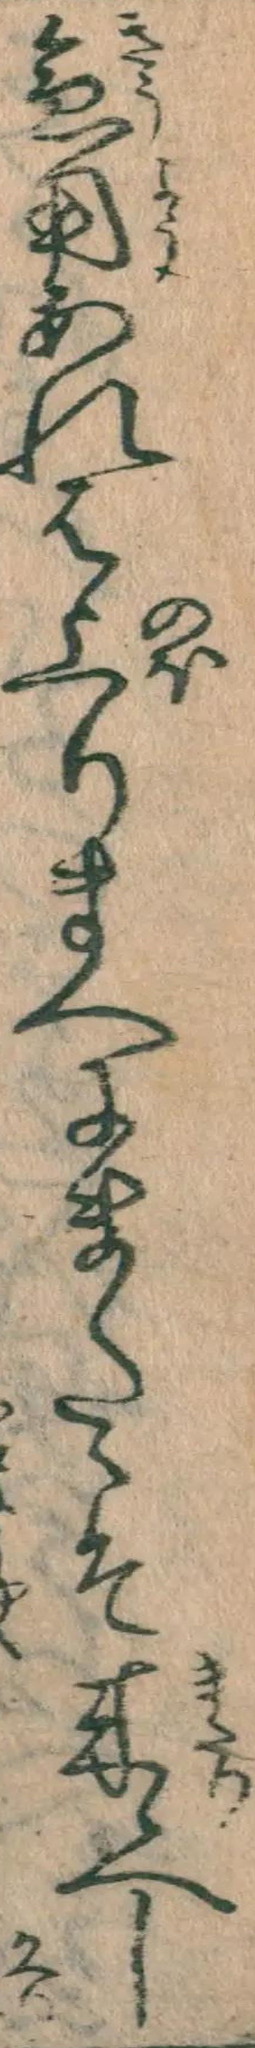急用あれは上りまへにまたこそ来候へし
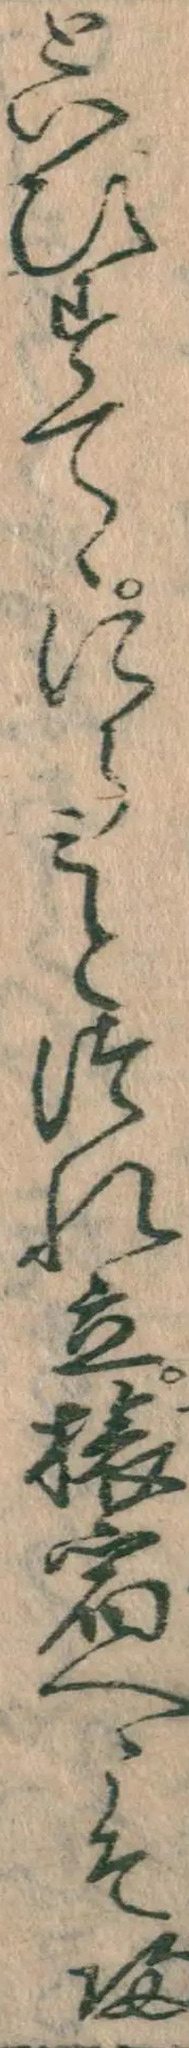といひすてゝ。にらみとつれ立。旅宿へこそ帰
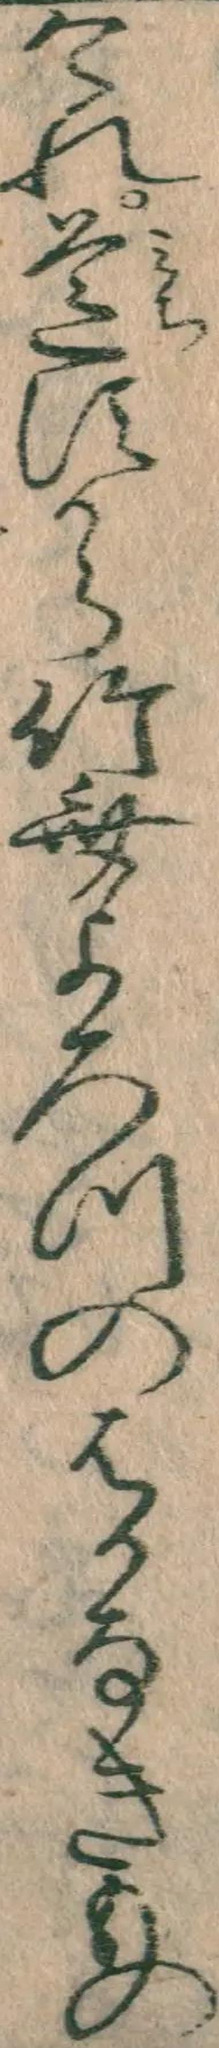けれ。道すから竹斎よろつのはかなきもの
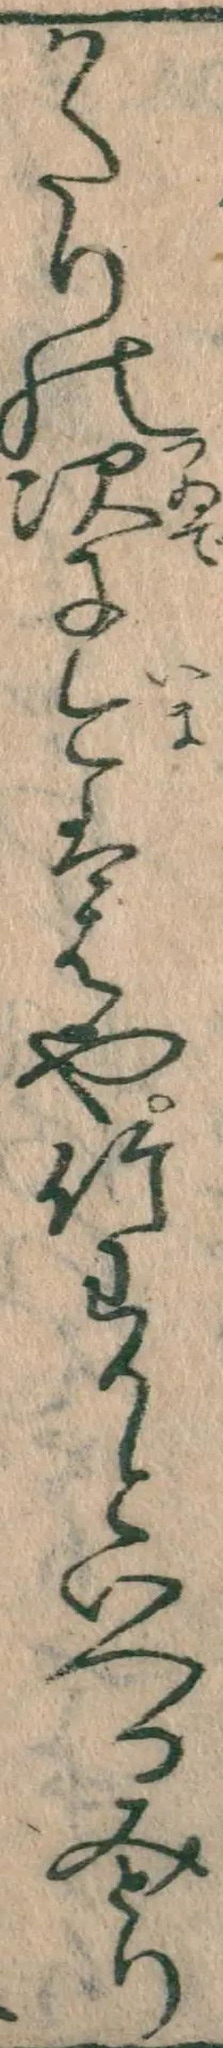かたりの次に今ははや。竹わかといへるみとり
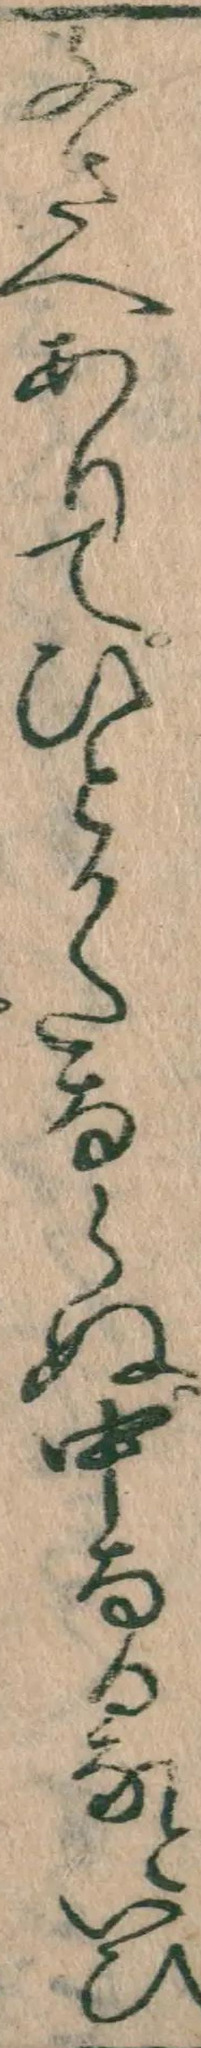子さへありて。ひとかたならぬ。中なるなといひ
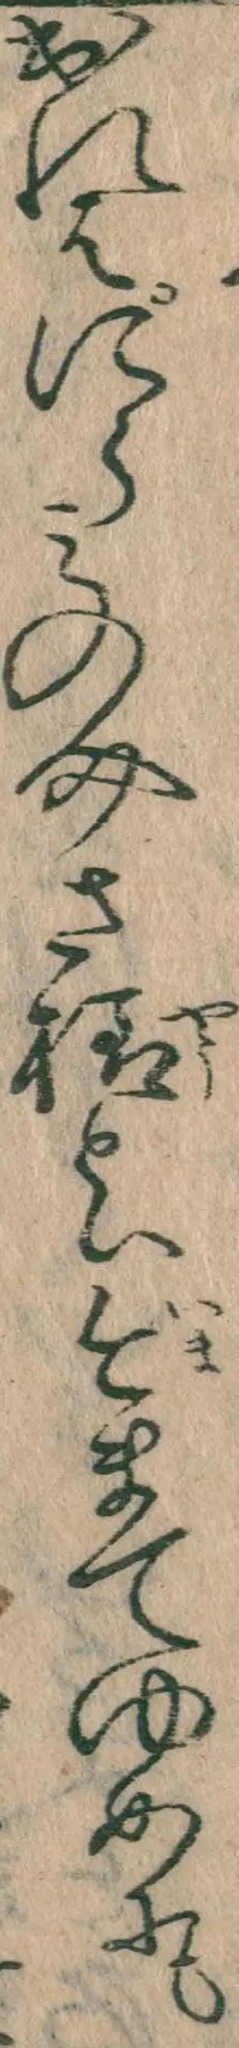出れは。にらみの介さ様とは今まてゆめにも
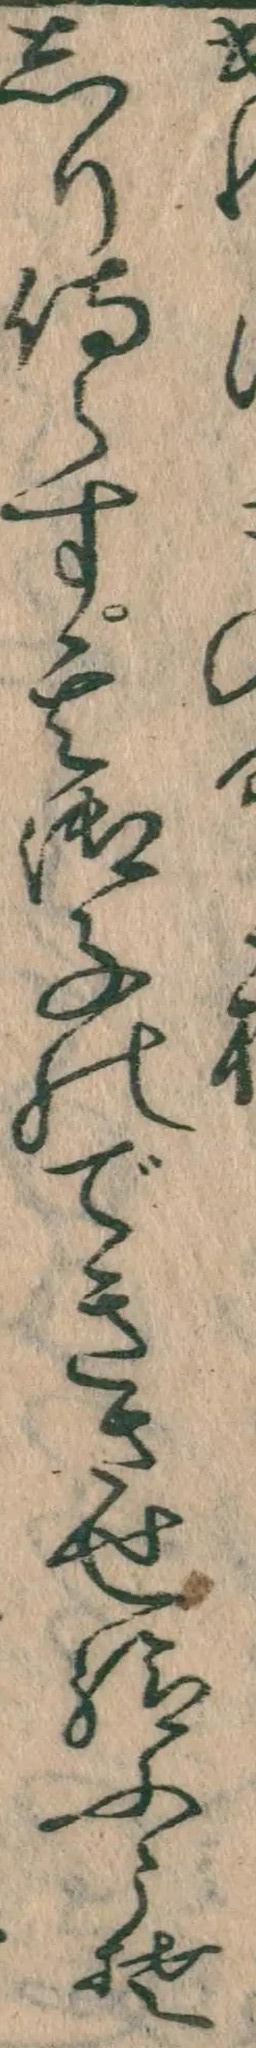しり侍らす。其御子のできさせ給ふこそ
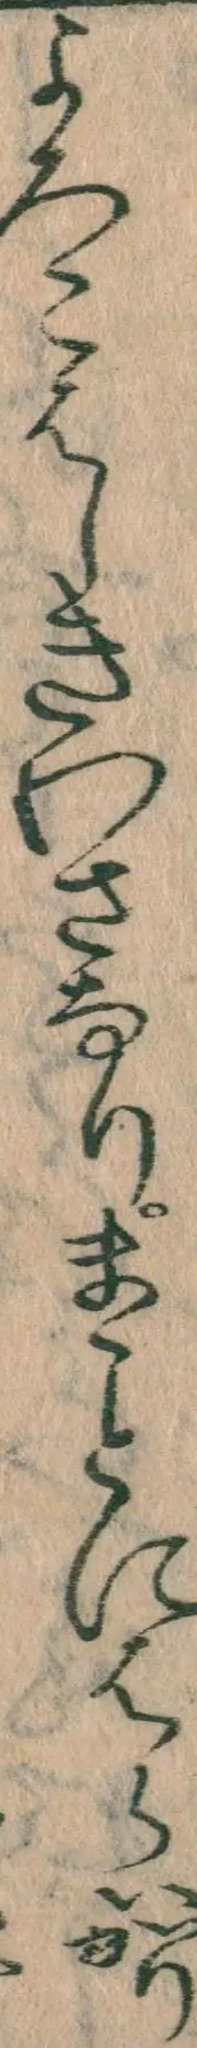よろこはしきわさなり。まことにはらはかり
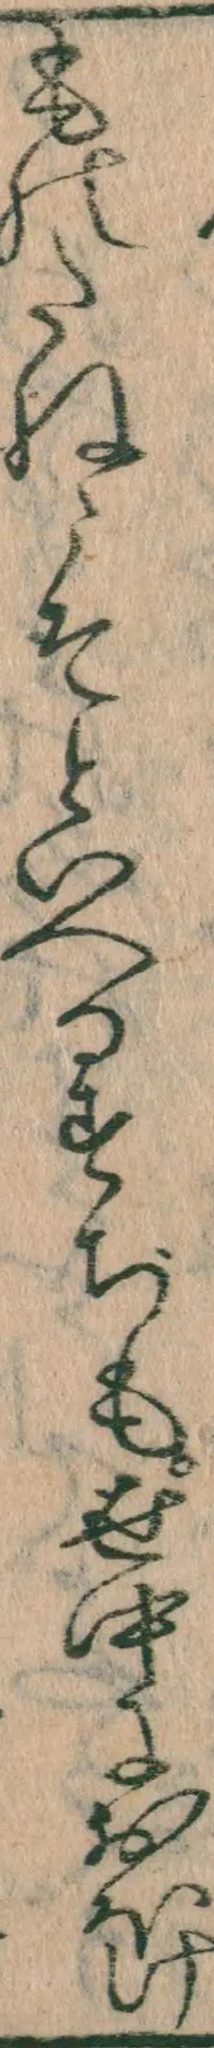ものたねこそといへるすぢも。世中におほけ
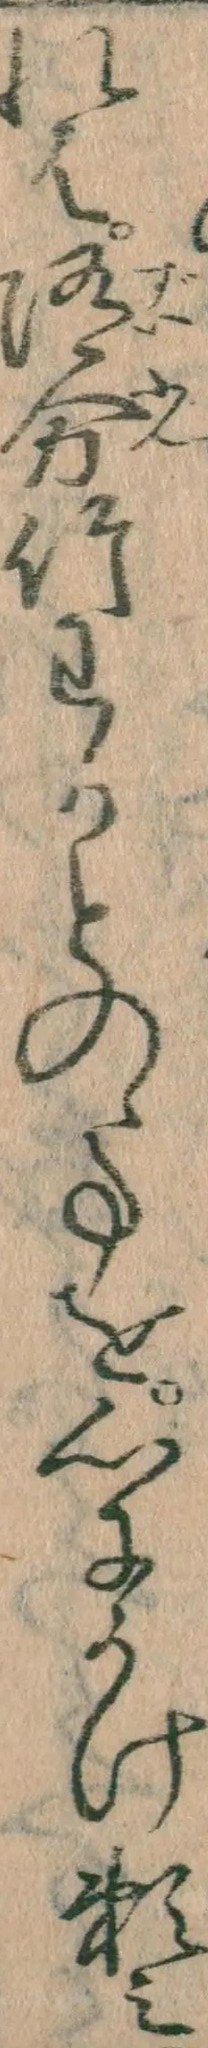れは。随分竹わかとのゝ事を。心にかけ頼み
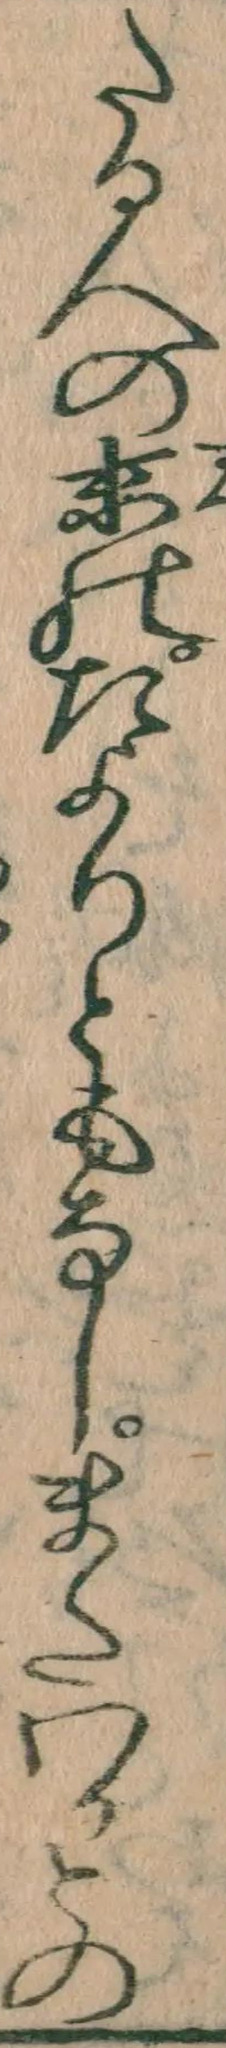たる人の末の。たよりともなし。またわかとの
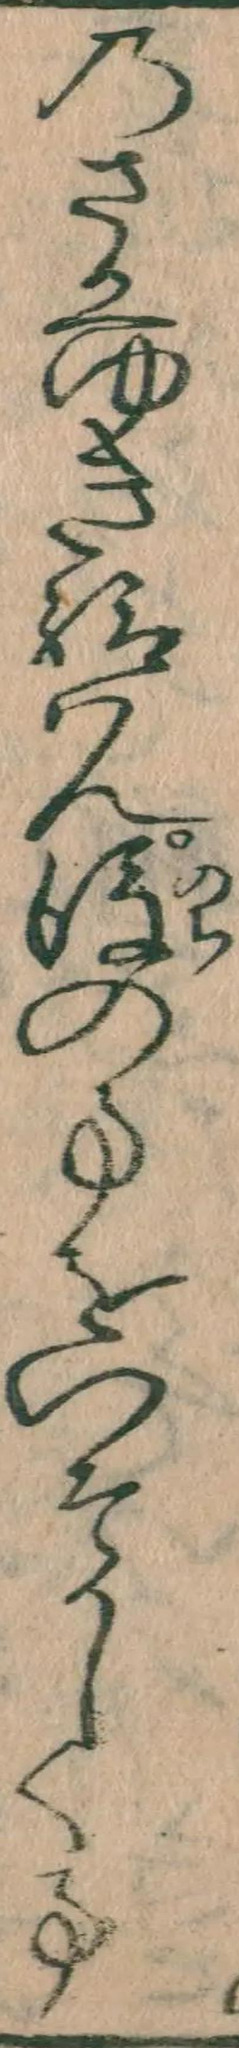のさかへゆき給はん。後の事をいそかしく事
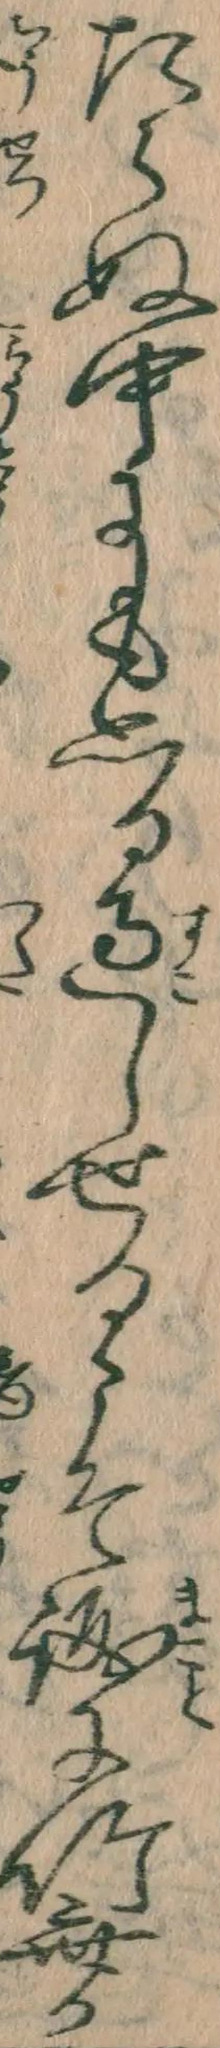たらぬ中にも思ひ過しせるこそ誠に竹斎か
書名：竹斎狂歌物語 3巻
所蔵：国立国会図書館 National Diet Library, JAPAN
